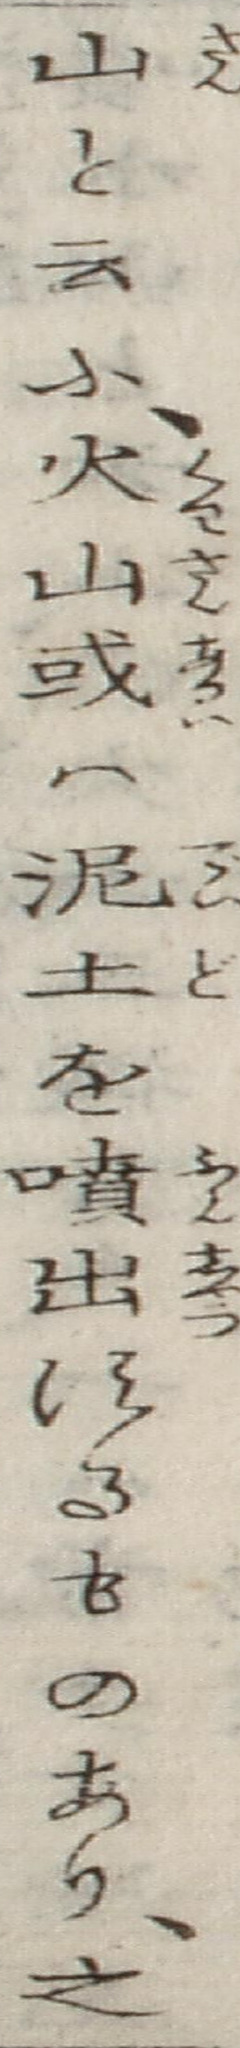山と云ふ、火山或は泥土を噴出するものあり、之
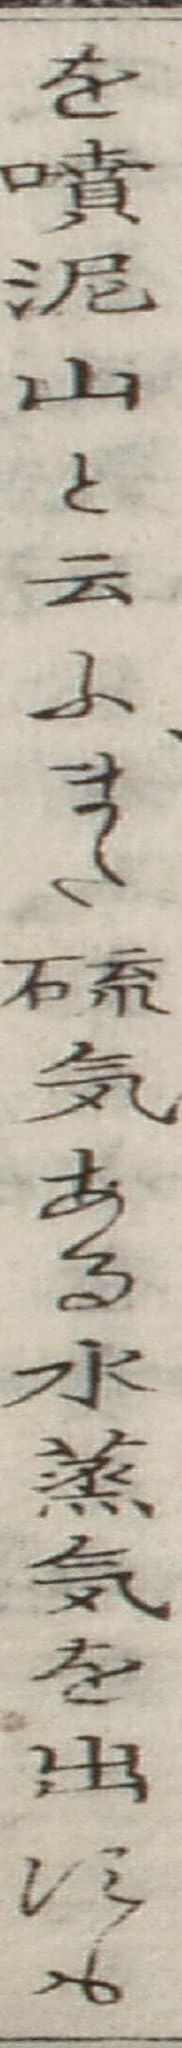を噴泥山と云ふ、また硫気ある水蒸気を出すも

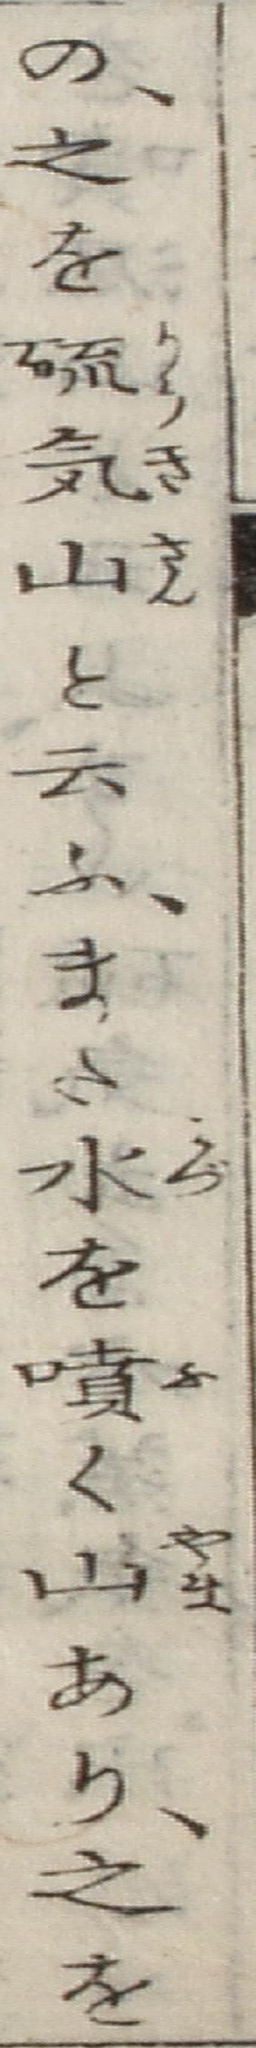の之を硫気山と云ふ、また水を噴く山あり、之を
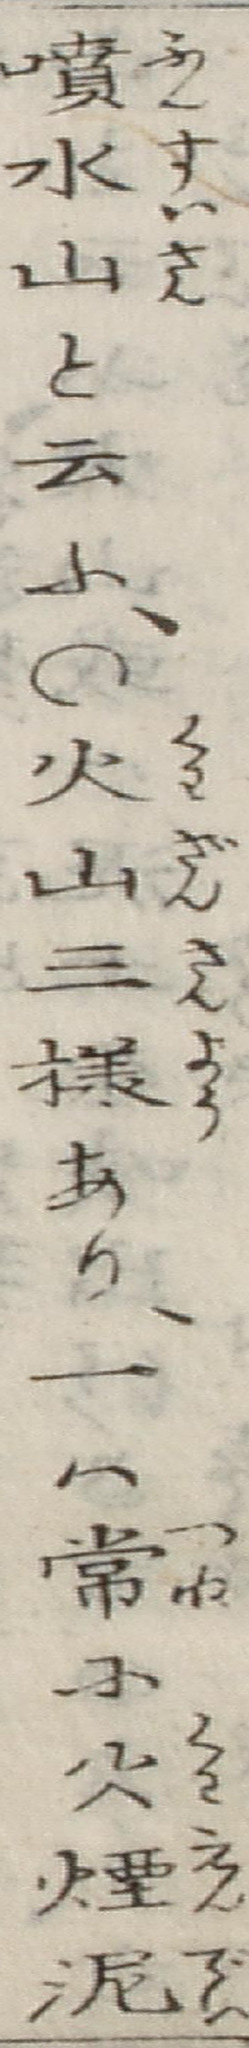噴水山と云ふ、〇火山漢字三様あり、一は常に火煙泥
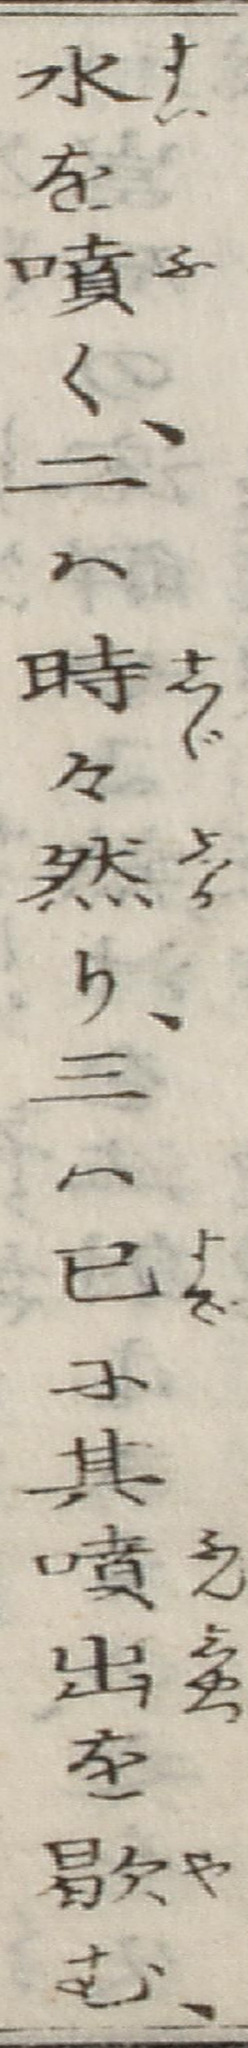水を噴く、二は時々然り、三は已に其の噴出を歇む、
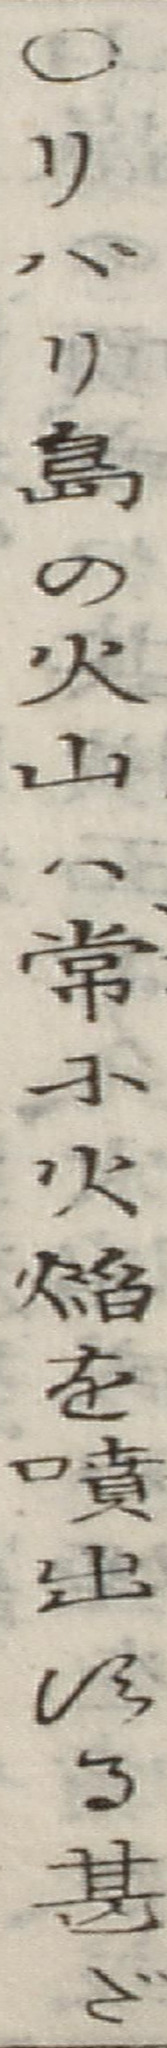〇リバリ島の火山は、常に火焔を噴出する甚だ
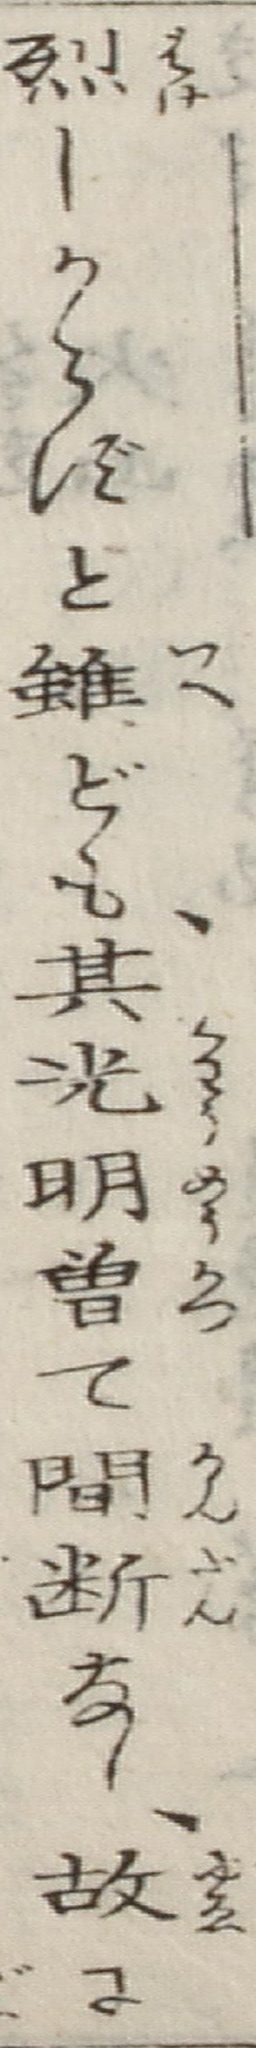烈しからずと雖ども、其光明曽て間断なし、故に
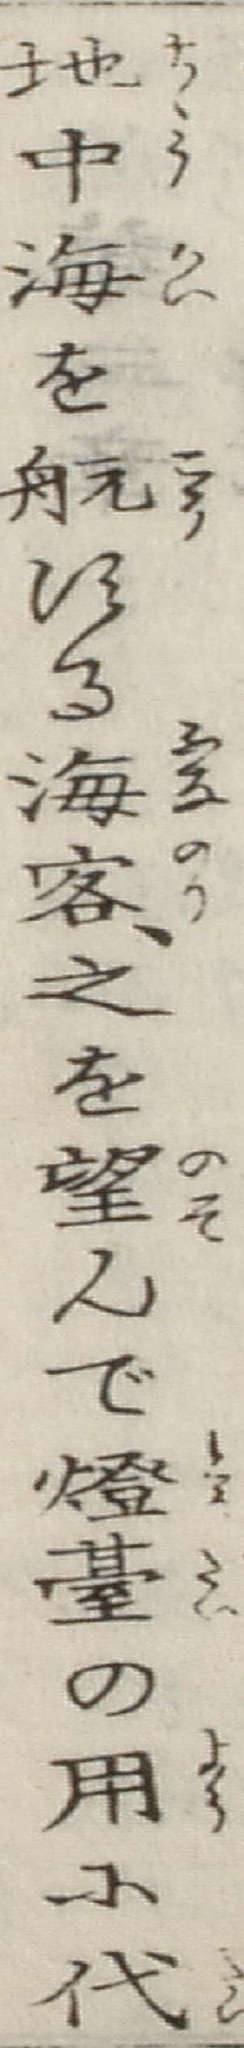地中海を航する海客、之を望んで燈台の用に代
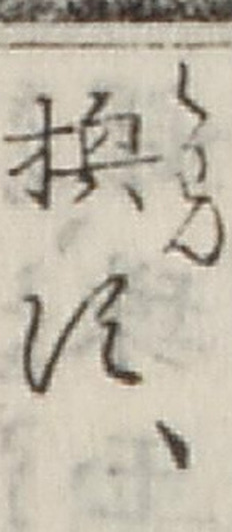換す、
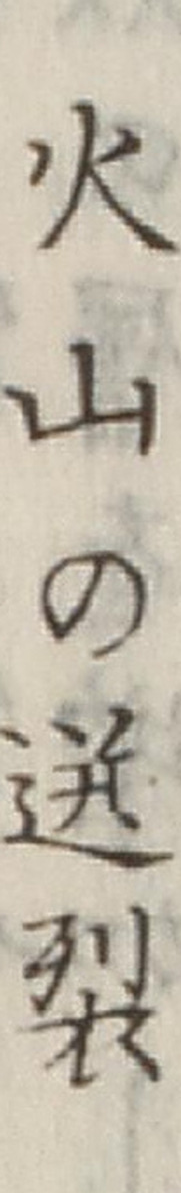火山の迸裂
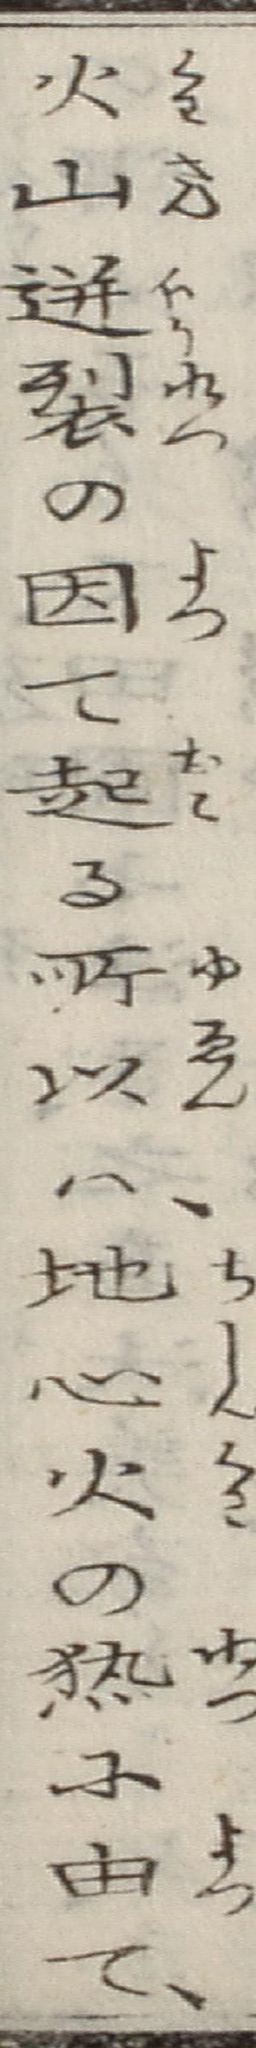火山迸裂の因て起る所以は、地心火の熱に由て、
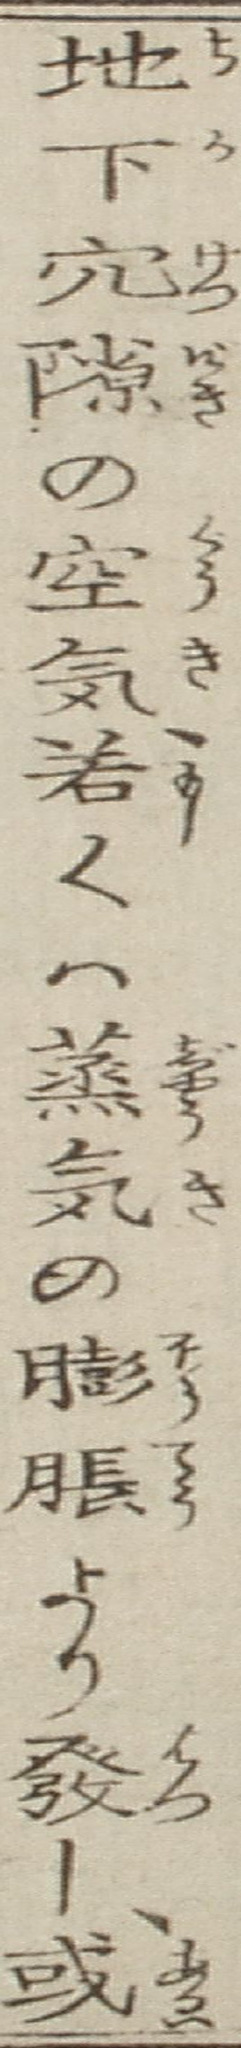地下穴隙の空気、若くは蒸気の膨張より発し、或
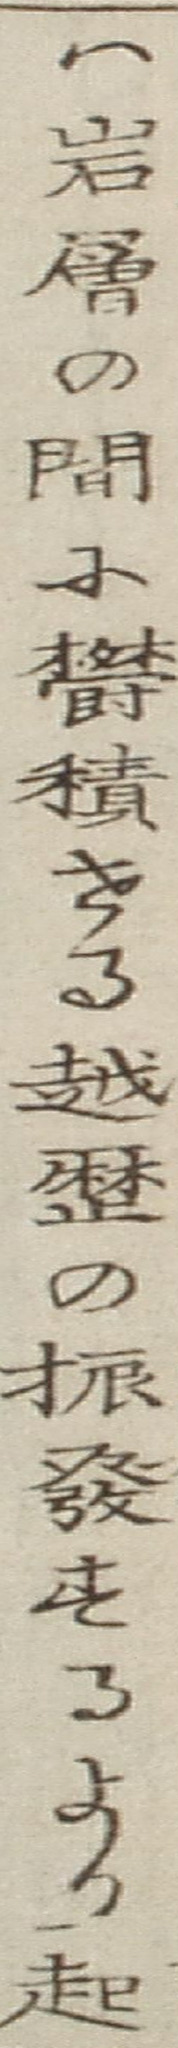は岩層の間に鬱積せる越歴の振発するより起
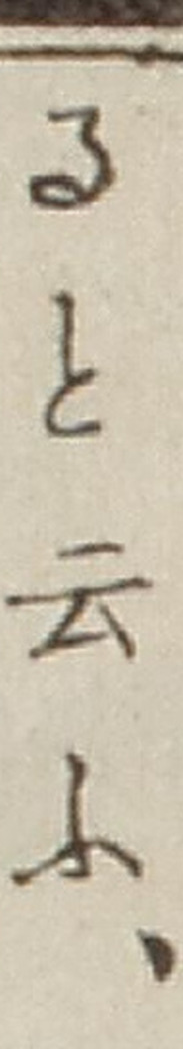ると云ふ、
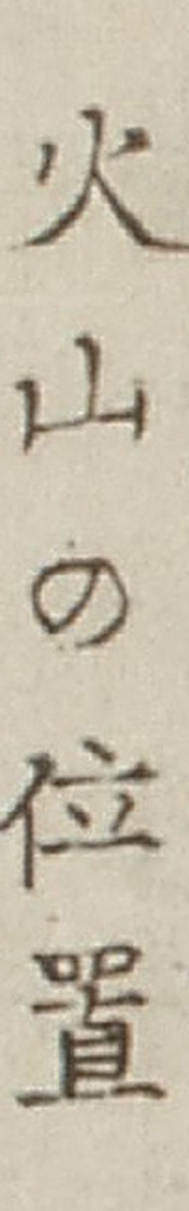火山の位置
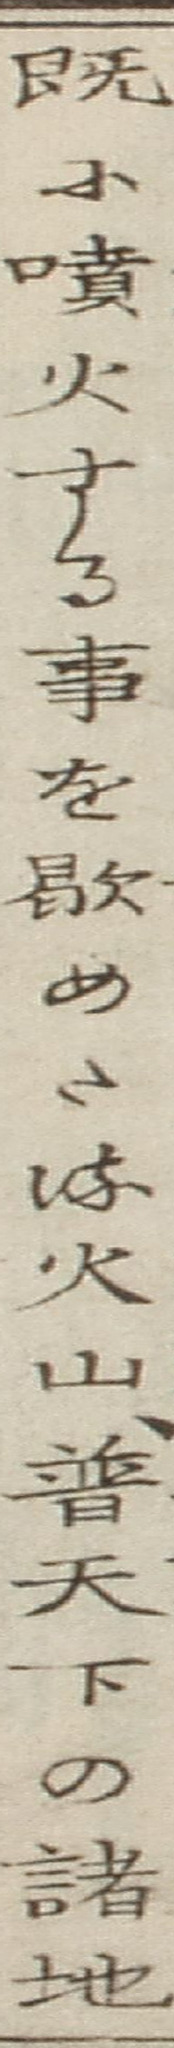既に噴火する事を歇めたる火山、普天下の諸地
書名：訓蒙　天然地理學　上
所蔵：東京大学地震研究所図書室 Earthquake Research Institute Library, The University of Tokyo, JAPAN
